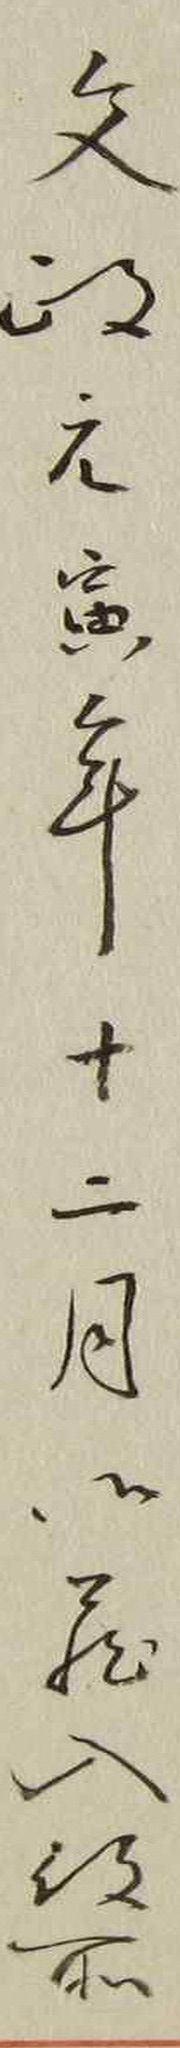文政元寅年十二月御蔵入役所
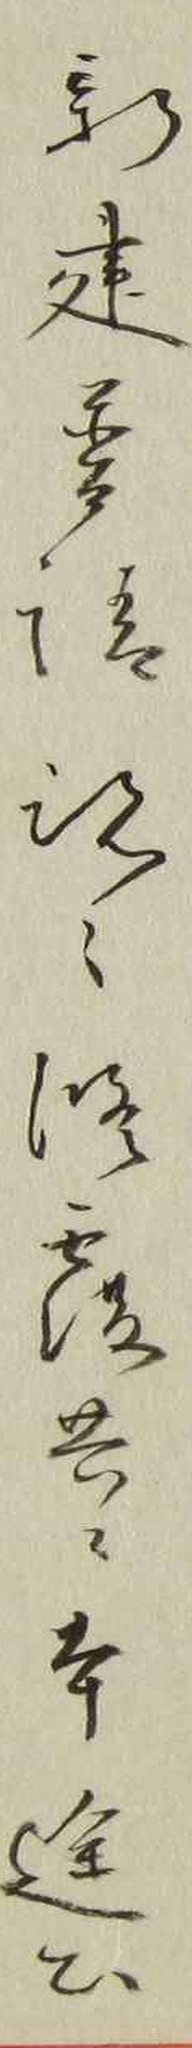新建普請跡々修覆共ニ本途出
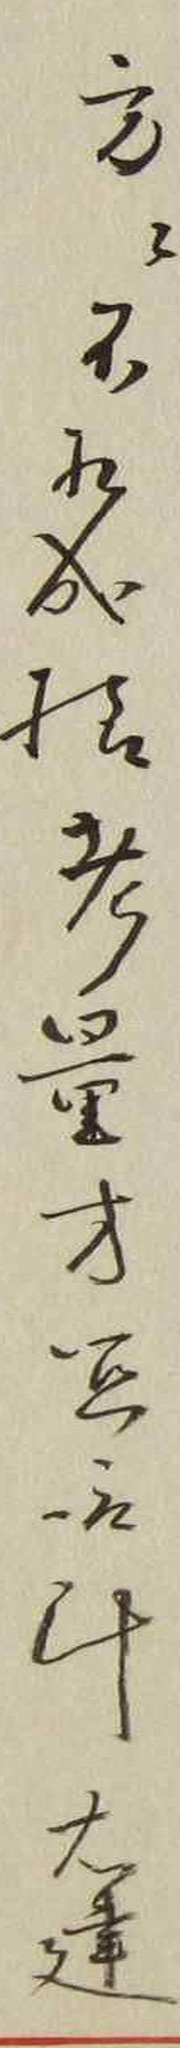方ニ不相成用考量方宜取計右建

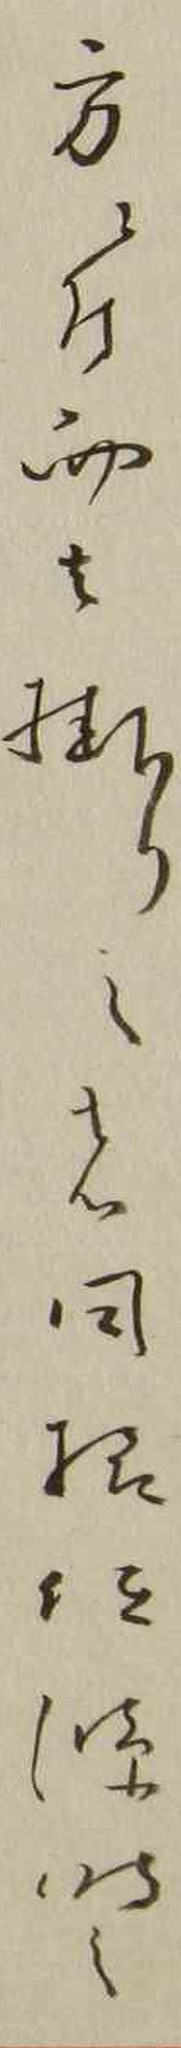方ニ付而者掛り之者同様任臨時之
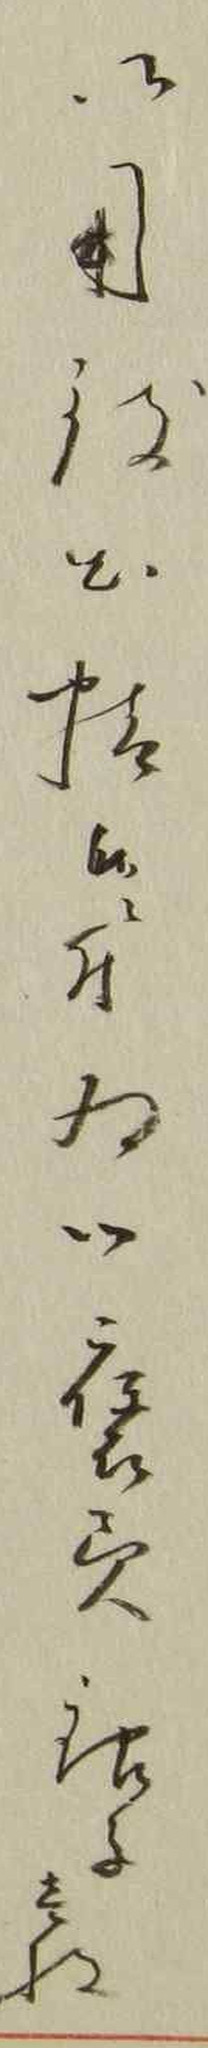御用致出精候ニ付為御褒美銀子壱枚
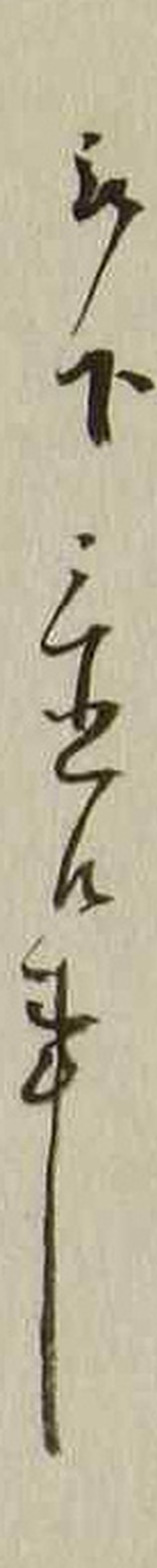被下置候事
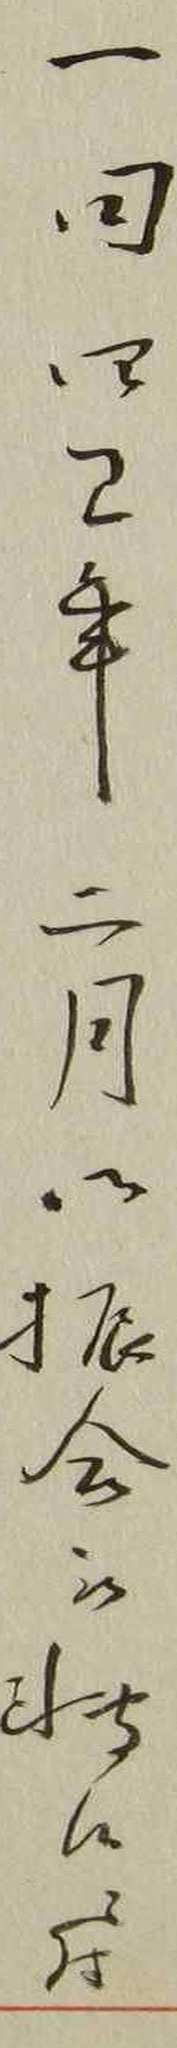一同四巳年二月御振合被転候ニ付
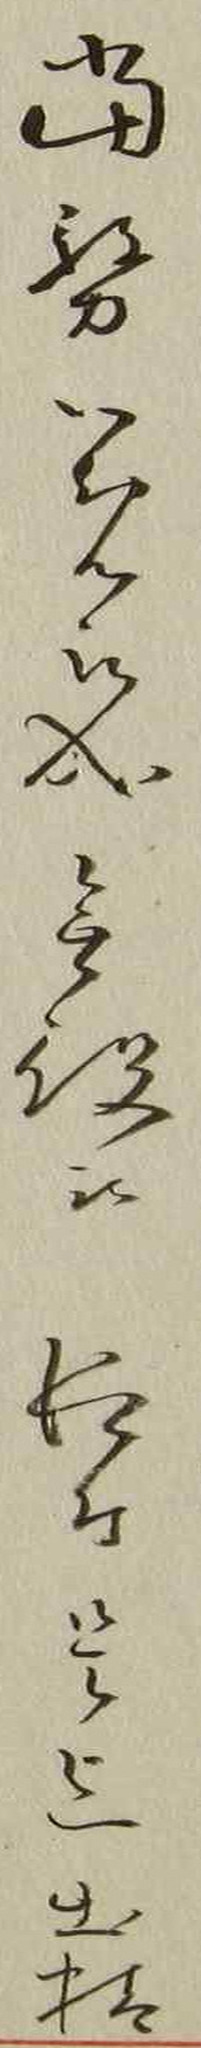当務御免被成無役被仰付是迄出精
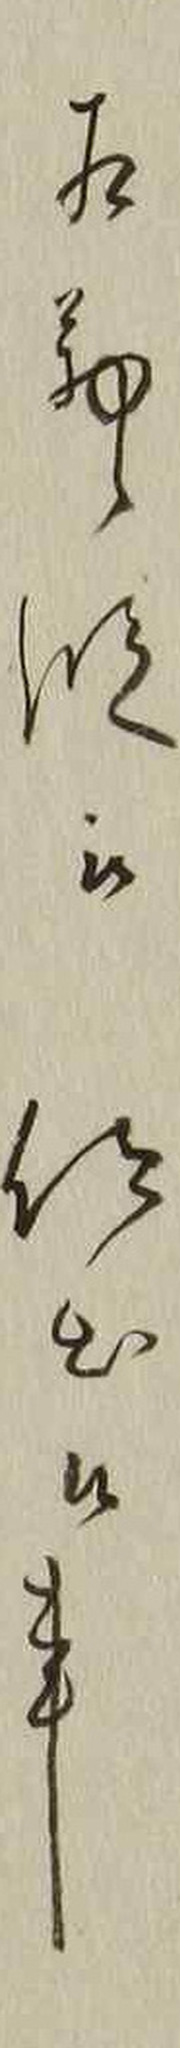相勤候段被仰出候事
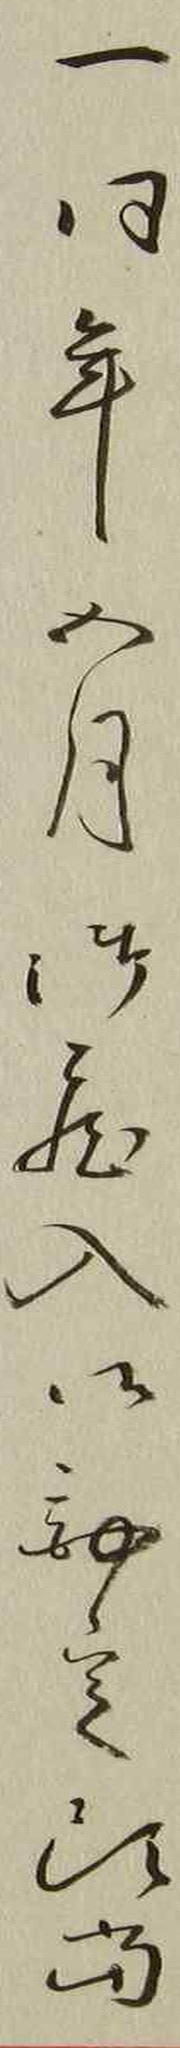一同年五月御蔵入御勘定頭当
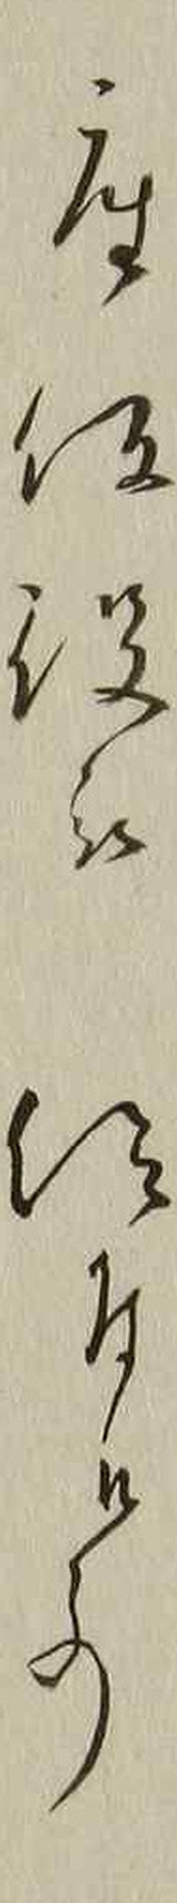座任役被仰付候事
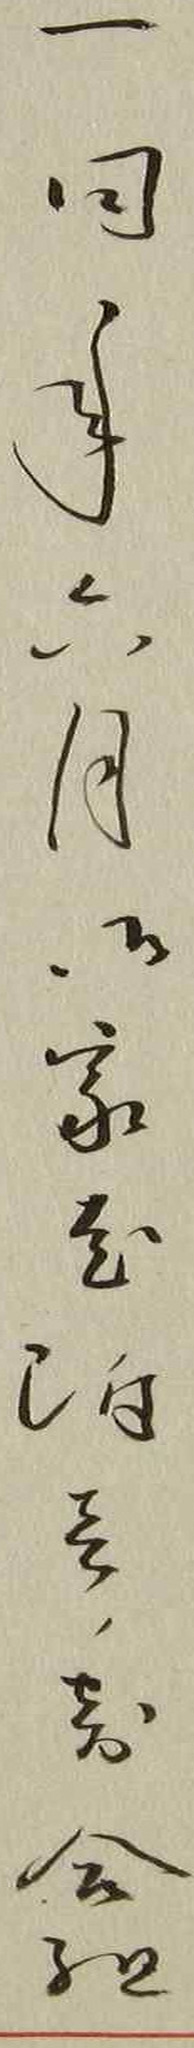一同年六月御家老附壱ノ寄合組
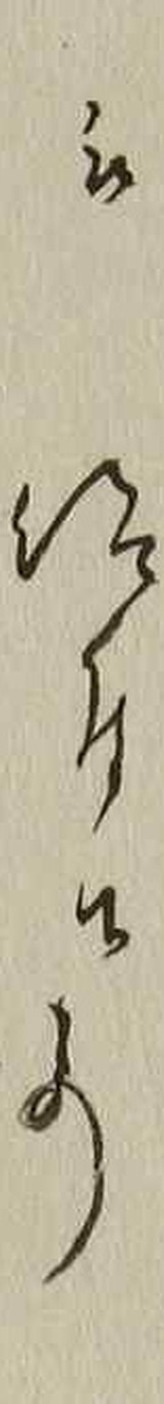被仰付候事
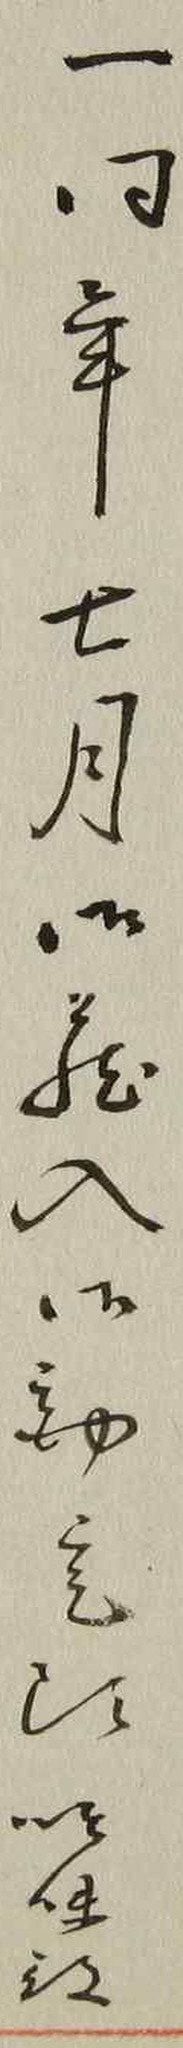一同年七月御蔵入御勘定頭吟味役
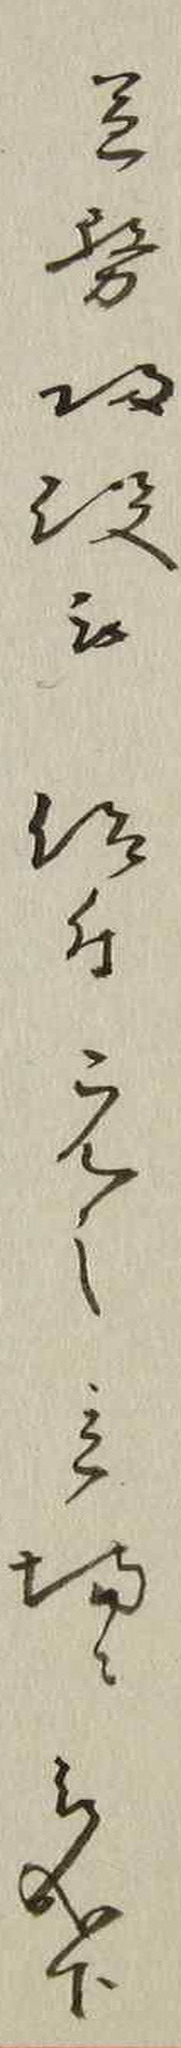兼務帰役被仰付元之立場ニ被成下
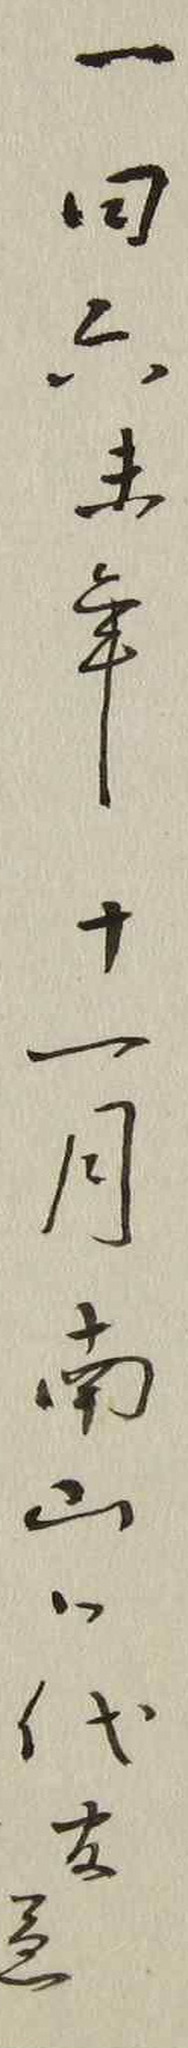一同六未年十一月南山御代官兼
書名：諸士系譜　巻之8　い之部8
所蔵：会津若松市立会津図書館
